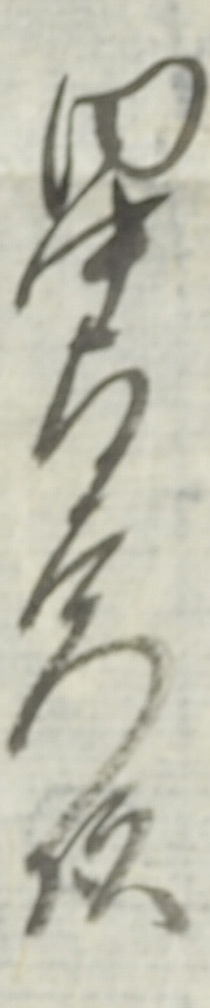田中与右衛門様

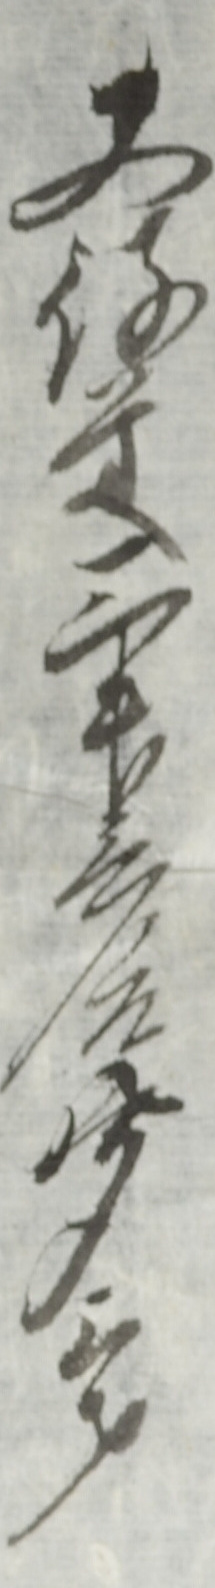夫役米三升壱合八勺三才
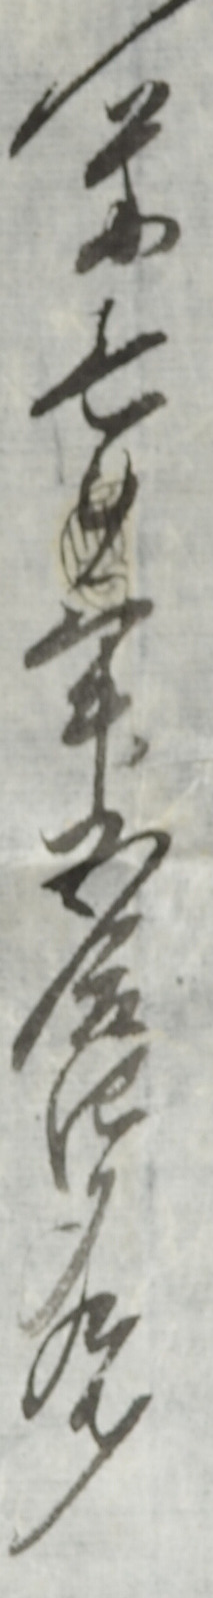〆米壱斗三升五合四勺九才
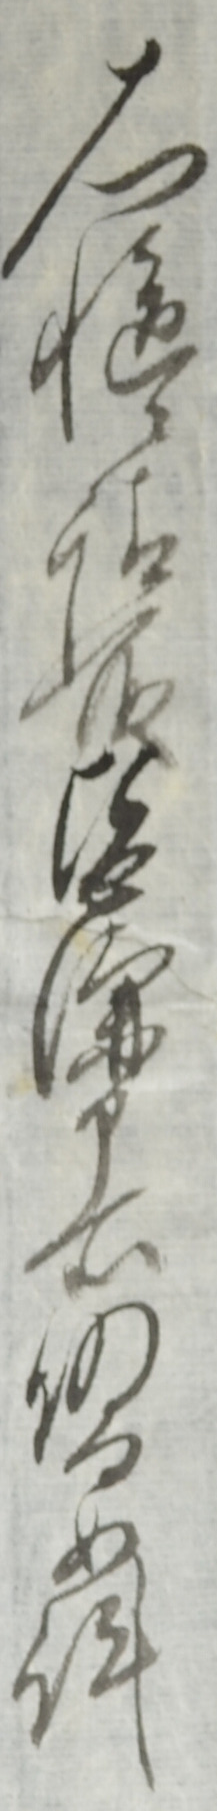右慥ニ請取皆済申所仍而如件
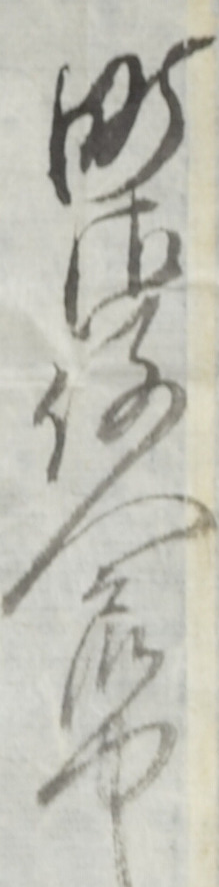町御役人衆中

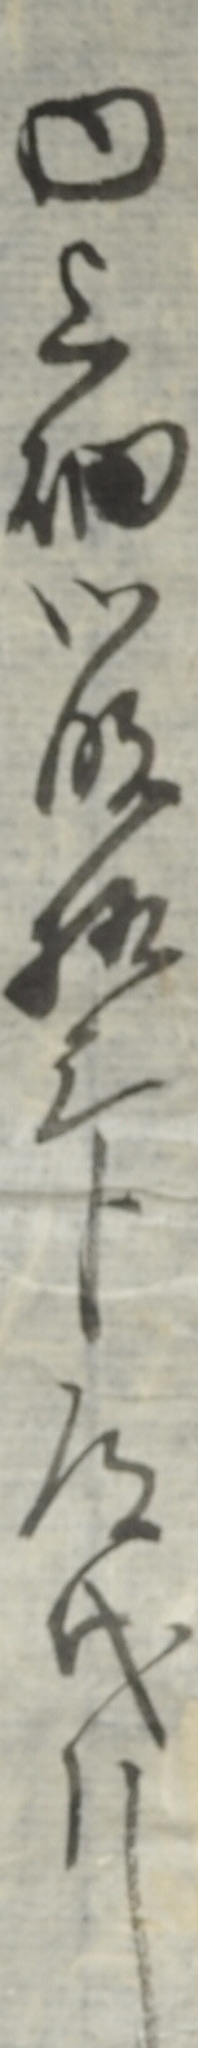内上畑弐段拾三分道代引
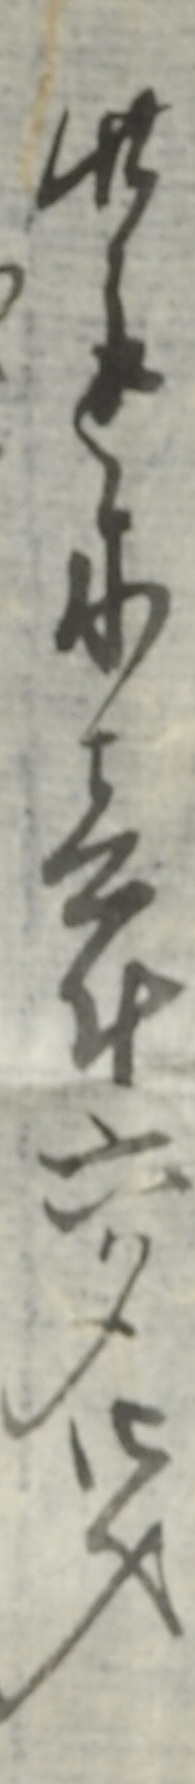此取米壱斗六勺四才
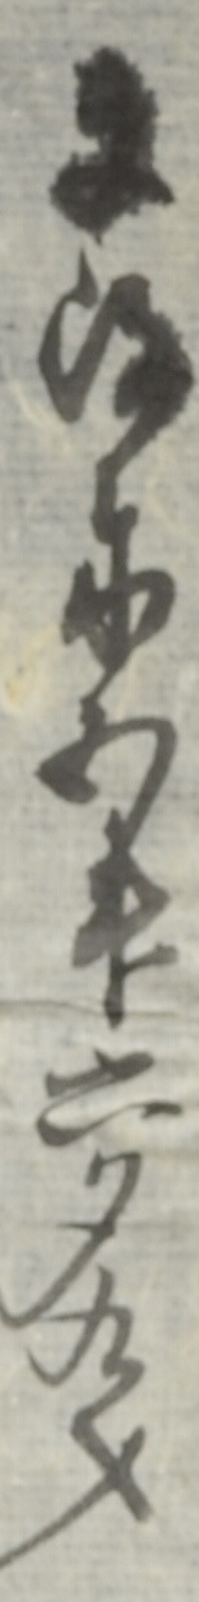夫役米五升六勺九才
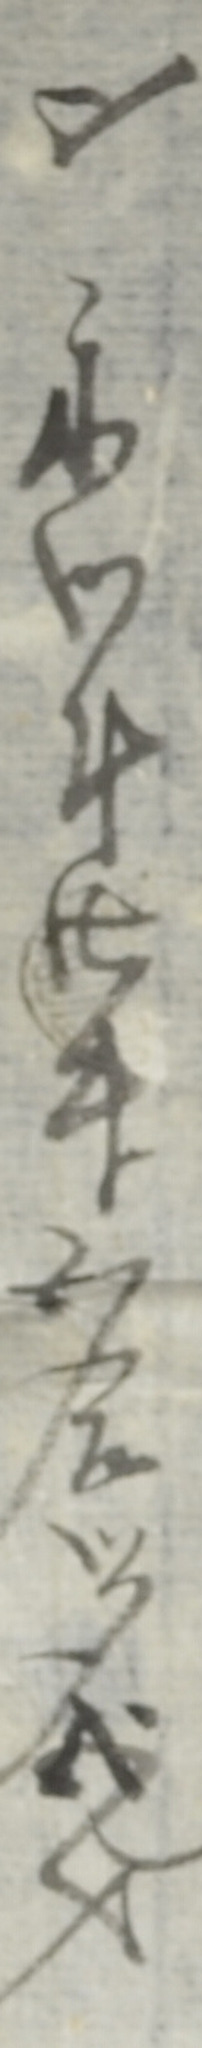〆米弐斗升五合弐勺弐才
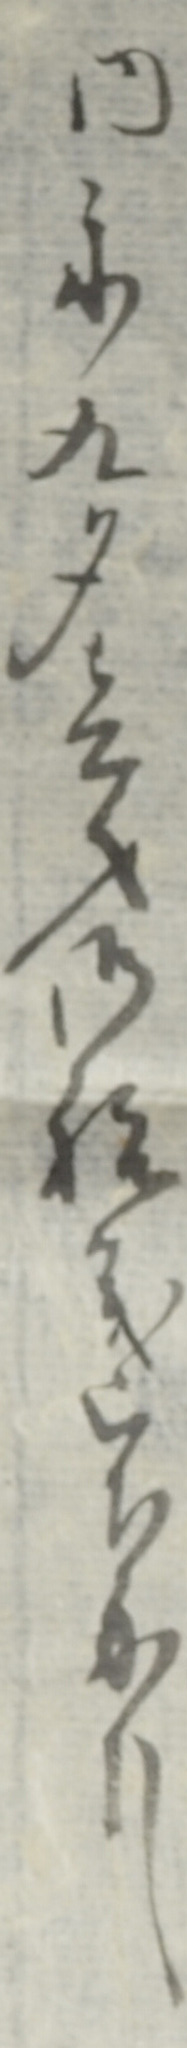内米九勺壱才御祝義被下引候
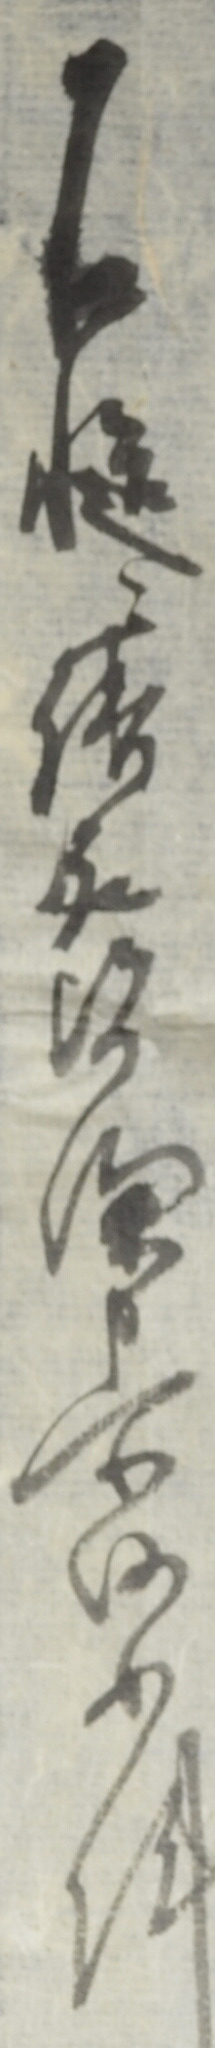右慥に請取皆済申所仍如件
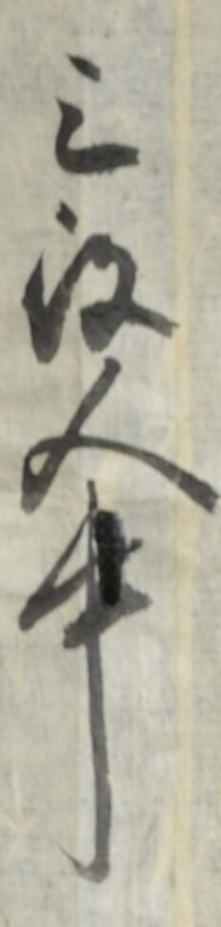三役人中

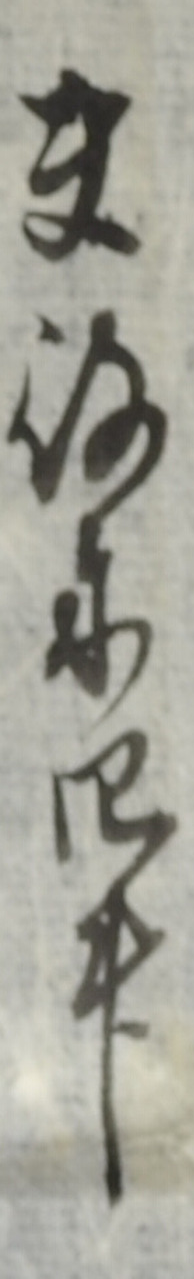夫役米四升
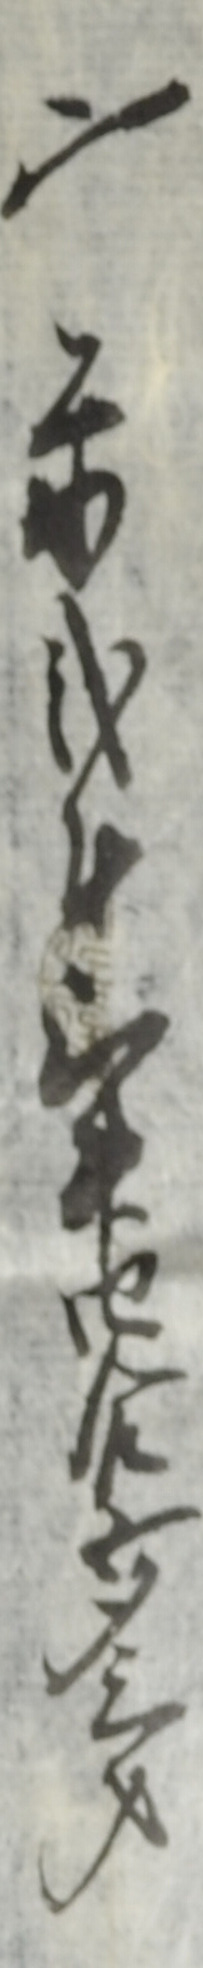〆米弐斗三升四合五勺三才
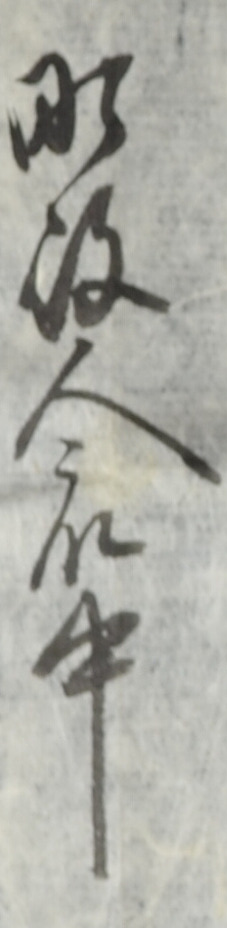町役人衆中

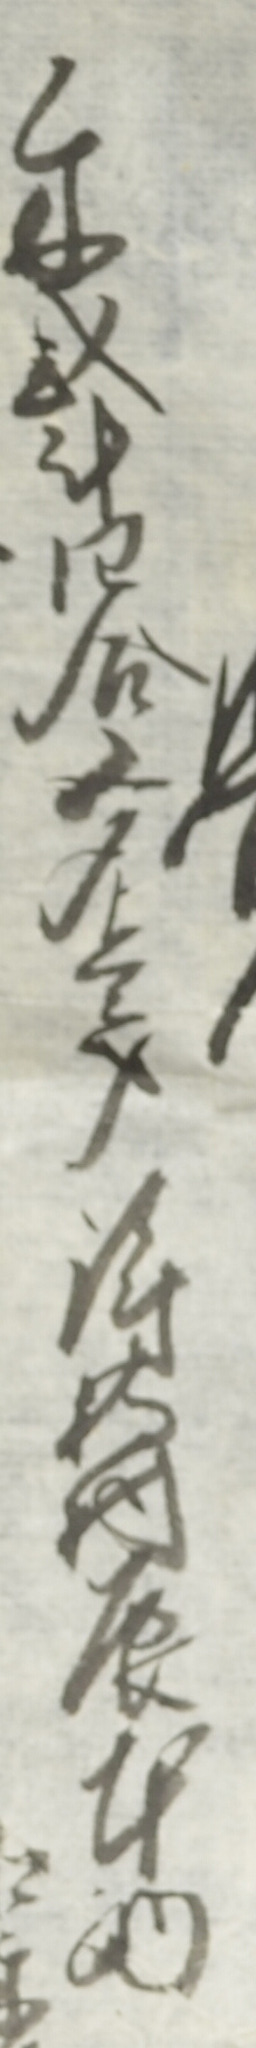米弐斗四合五勺壱才鉾持村辰本納
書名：鉾持村皆済権現道附替畝歩書付
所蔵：伊那市立高遠町図書館・合同会社AMANE
